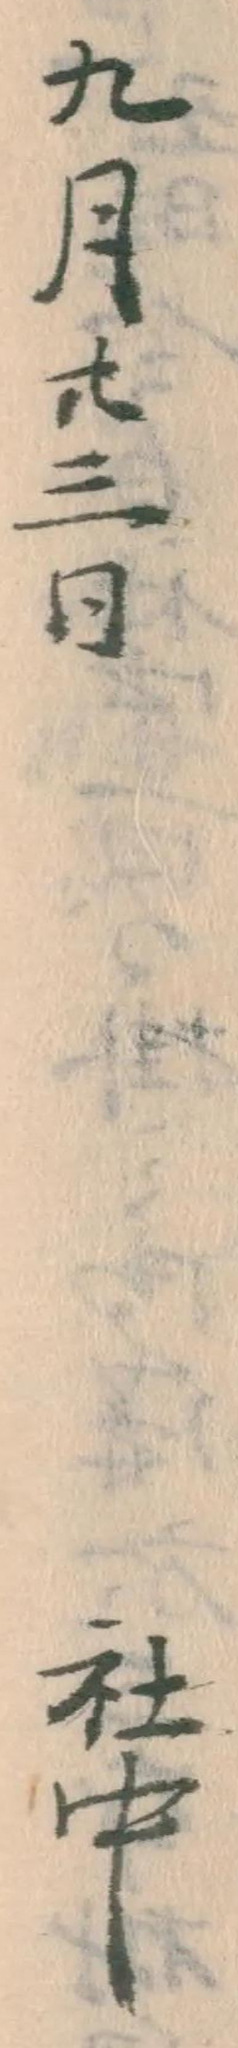九月廿三日社中
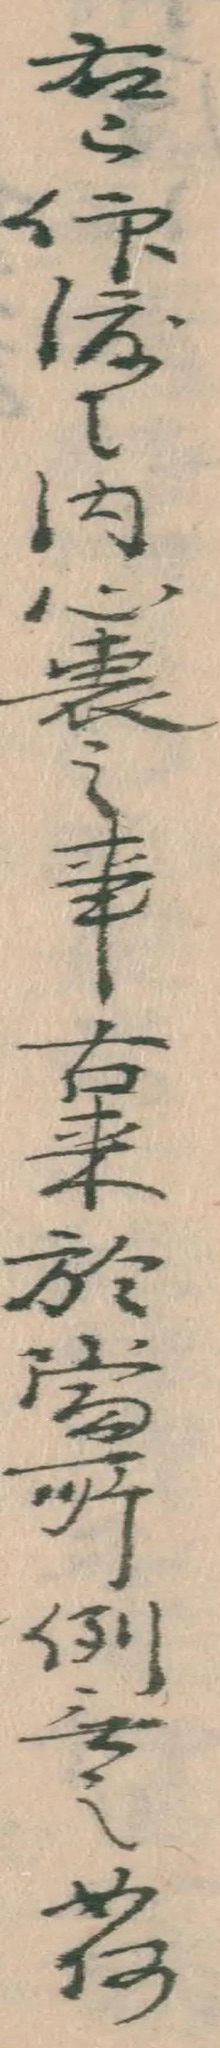右被仰渡之内心衷之事古来於當所例無之如何
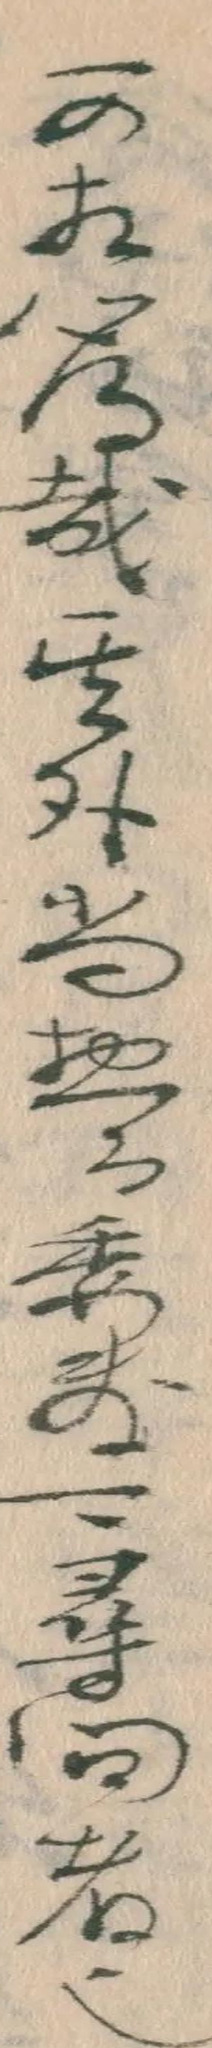可相心得哉其外尚惣而委敷可尋問者也
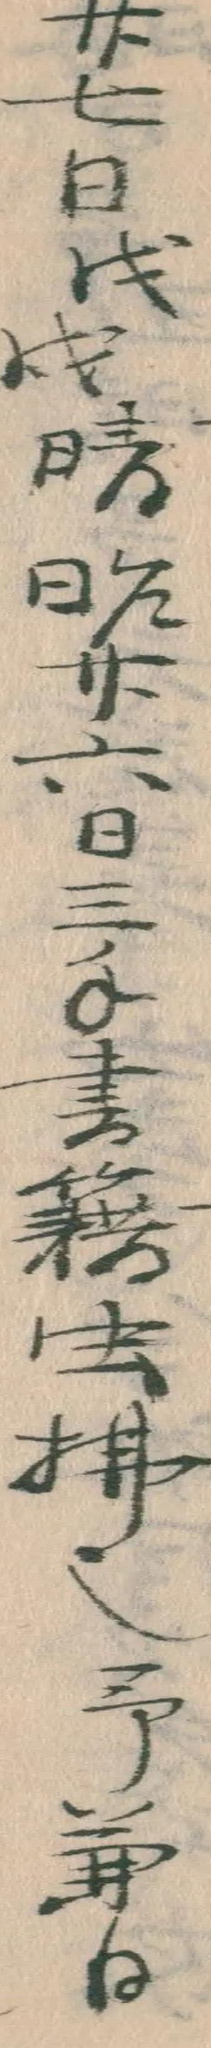廿七日戊戌晴昨廿六日三手書籍虫払也予兼日
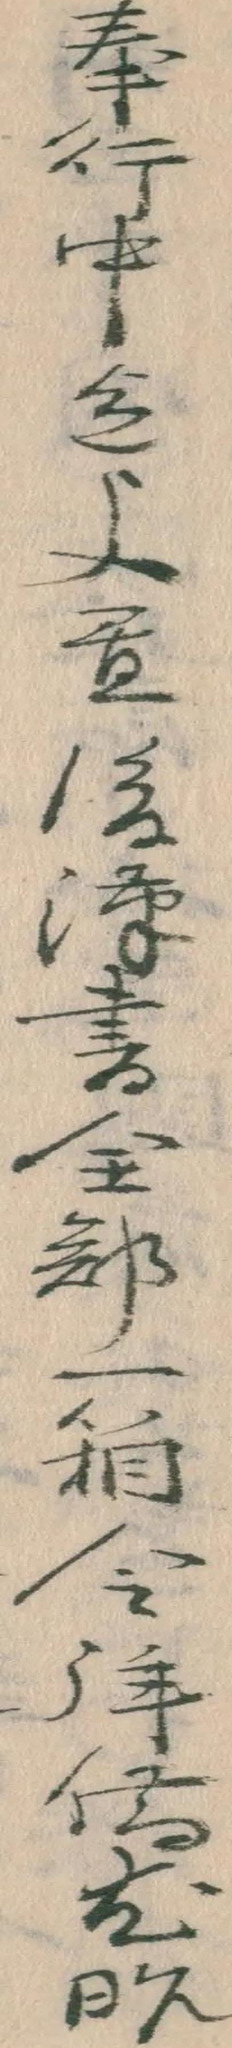奉行中迄被入置後浄書全部一箱令拝借尤昨
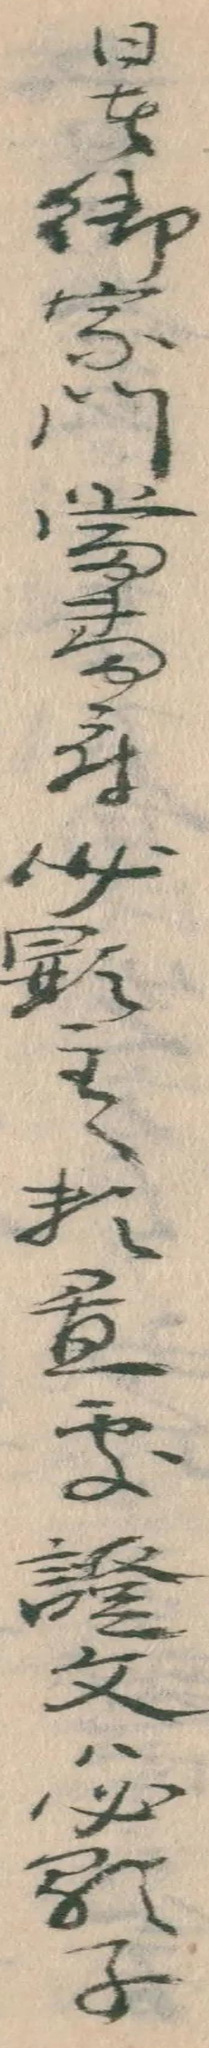日本御家門當番ニ付必顕主へ頼置處證文ハ必顕子
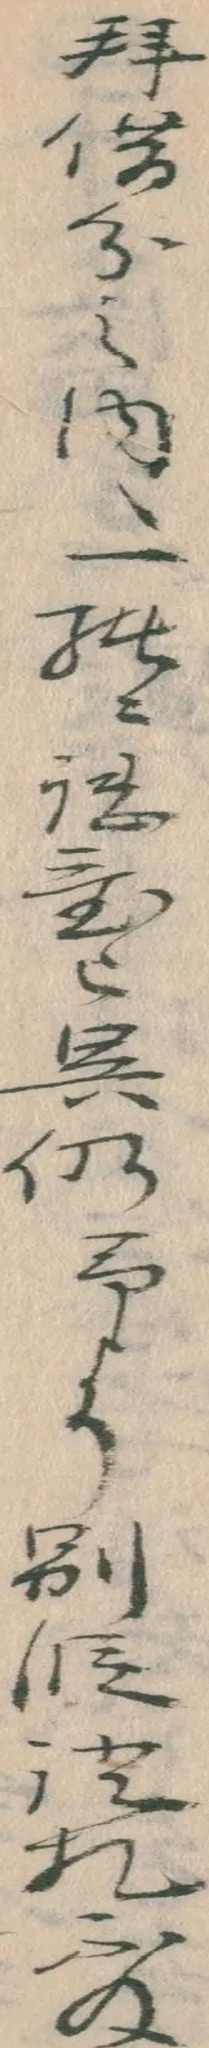拝借分之内へ一張に認置被呉仍予より別段證札不及
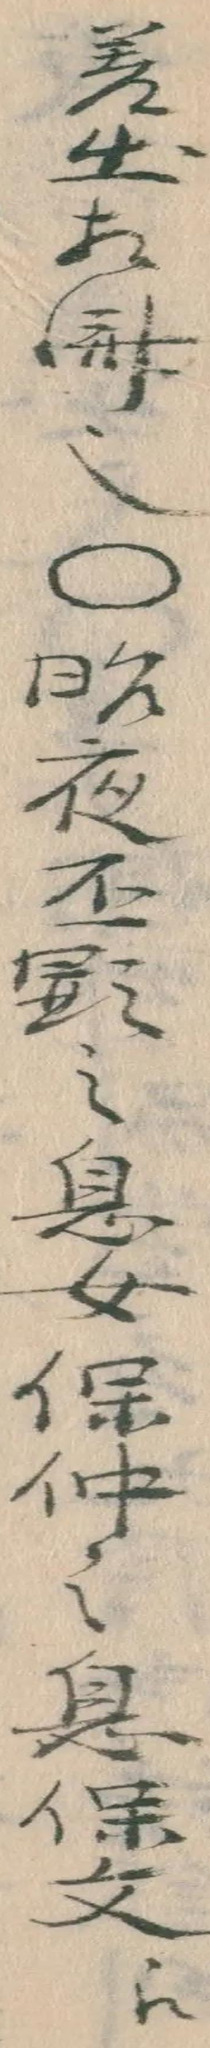差出相済也○昨夜丕顕之息女保仲之息保文え
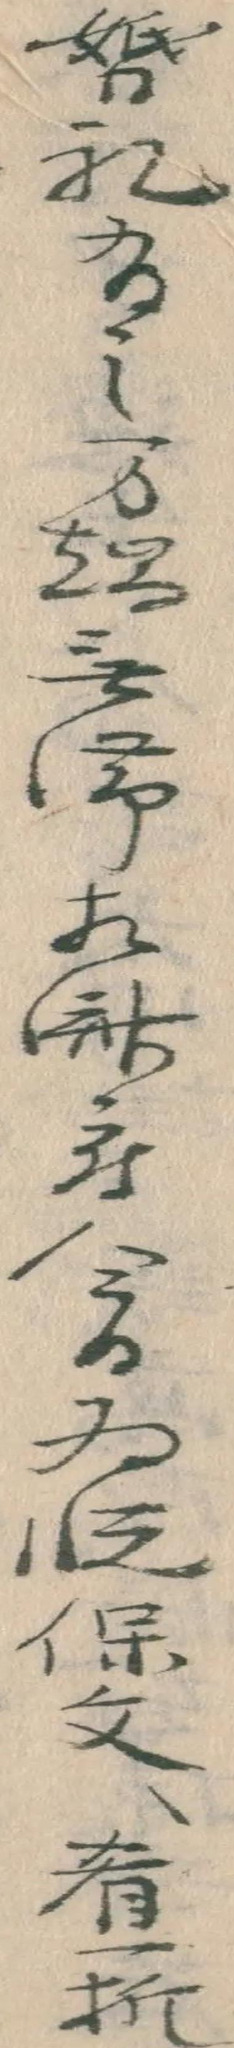婚礼有之万端無滞相済ニ付今日為祝保文へ肴一折
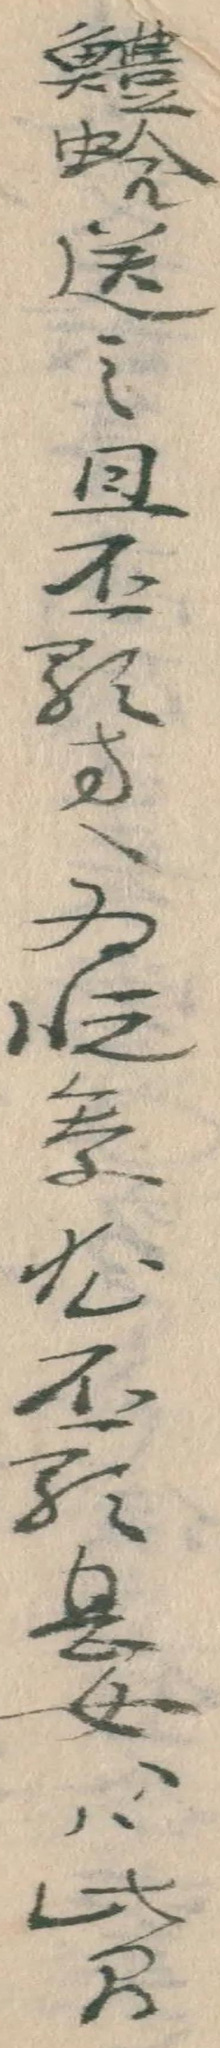鱧蛤送之且丕顕方へ為祝参尤丕顕息女ヘハ此間
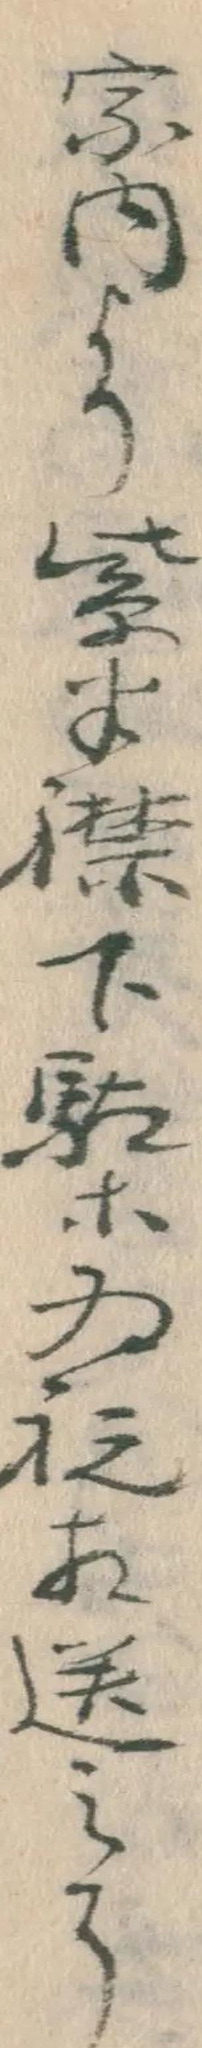家内より紫半襟下駄等為祝相送之事
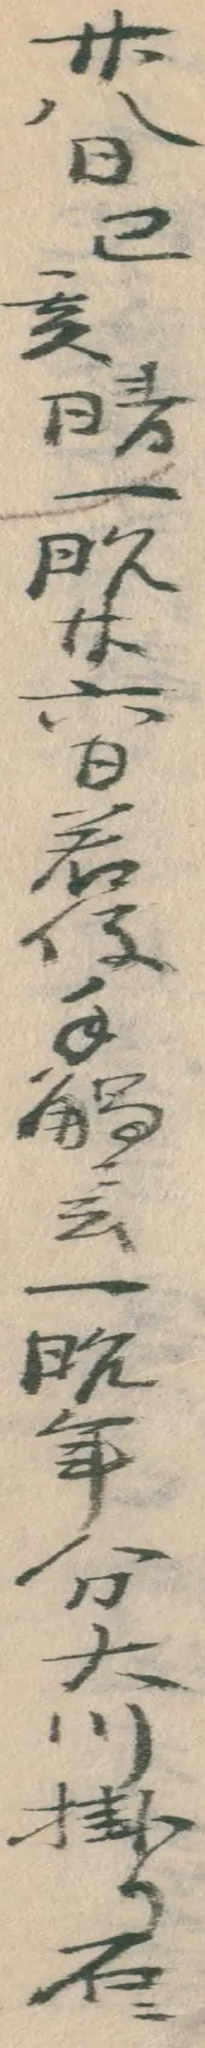廿八日己亥晴一晩廿六日若役手触ニ云一昨年分大川掛リ石ニ
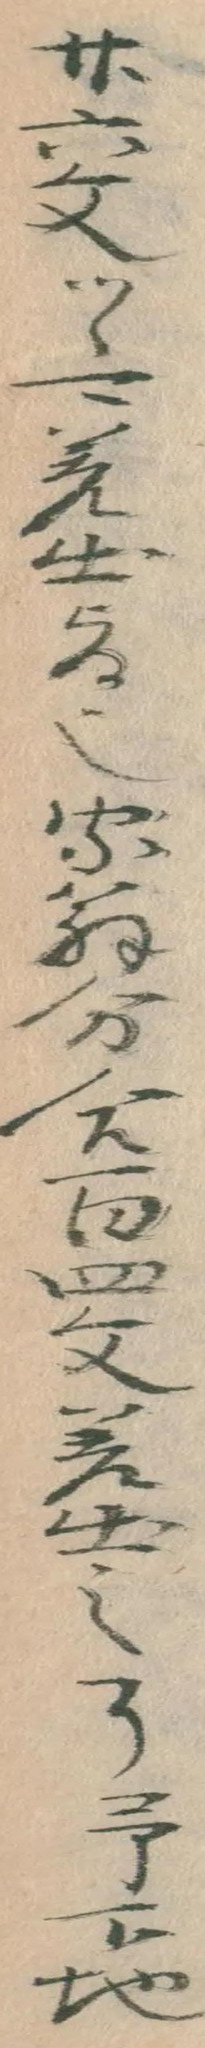廿六文ツヽ可差出旨也家翁分合百四文差出之了予下地

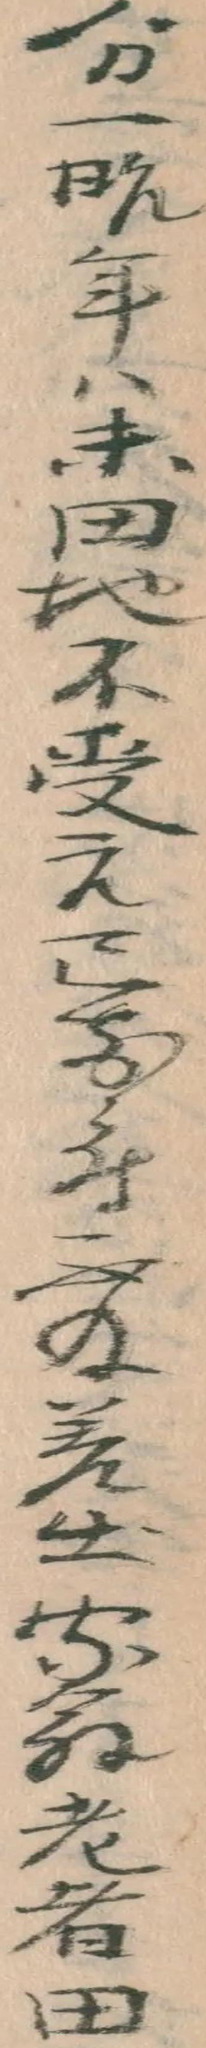分一昨年ハ未田地不受元已前ニ付不及差出家翁老者田
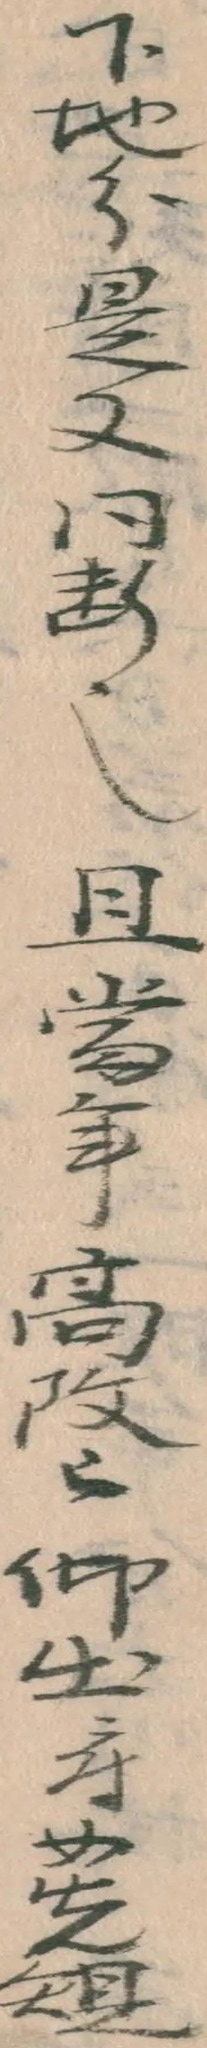下地分是又同断也且當年高改被仰出ニ付如先規
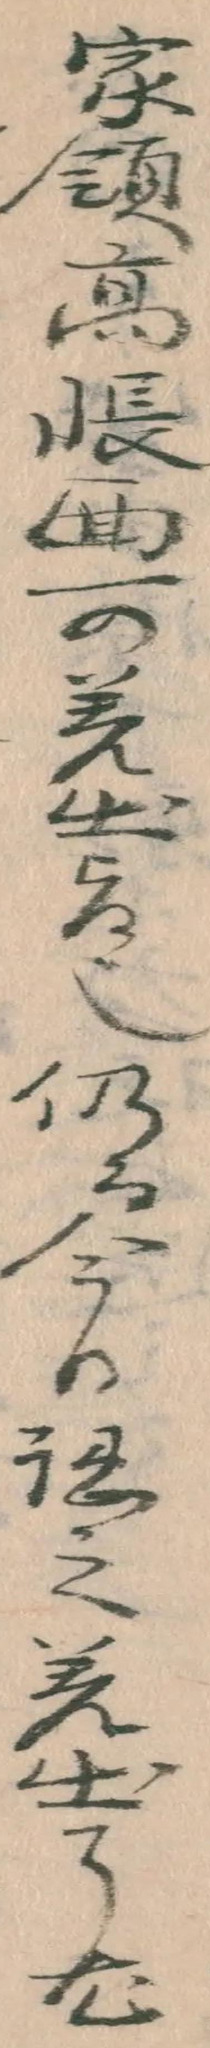家領高帳面可差出旨也仍而今日認之差出了尤
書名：賀茂社記録. 第63冊
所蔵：国立国会図書館 National Diet Library, JAPAN
